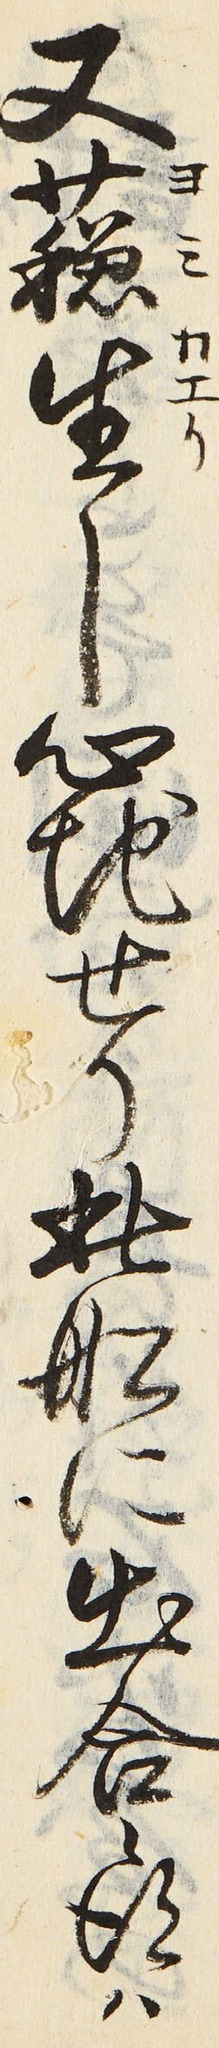又蘇生し心地せり此船に出合候得は
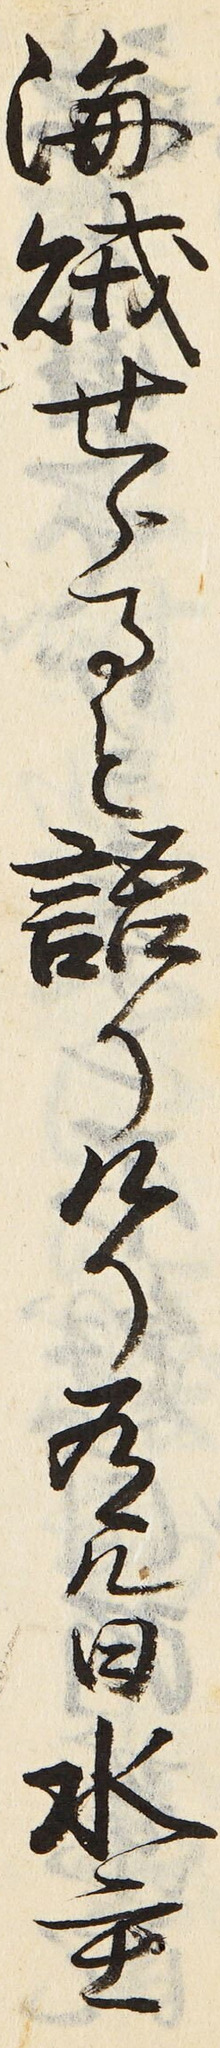海賊せらるとかた語りけり有る日水主
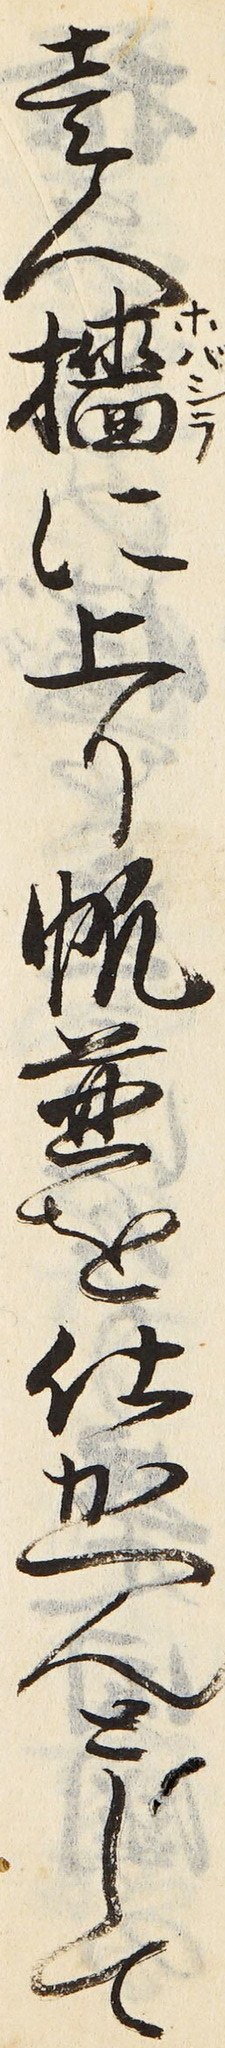壱人檣に上り帆並を仕かへんとして
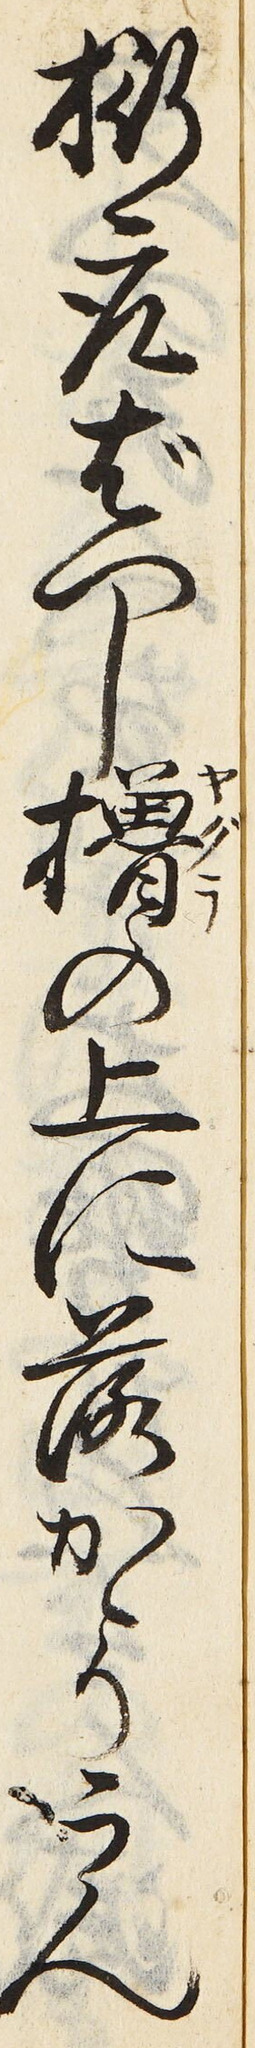桁取ばつし櫓の上に落かゝりうん
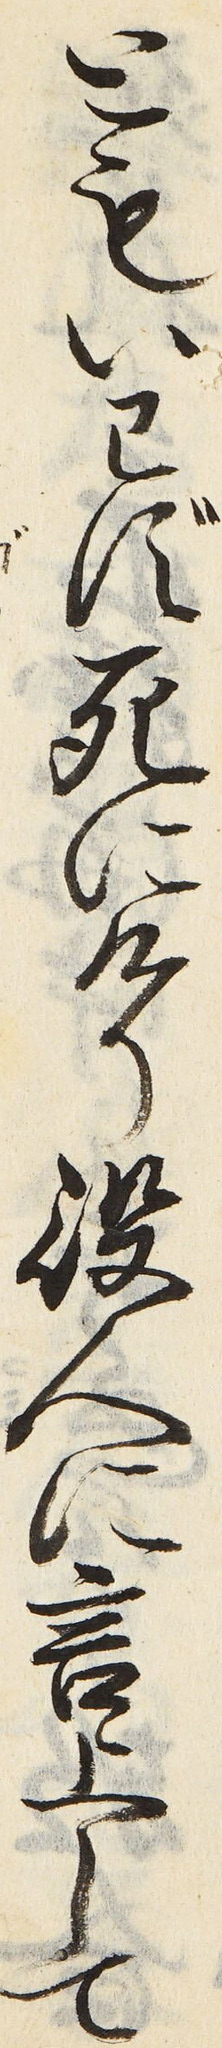ともいわず死にけり役人に言上して
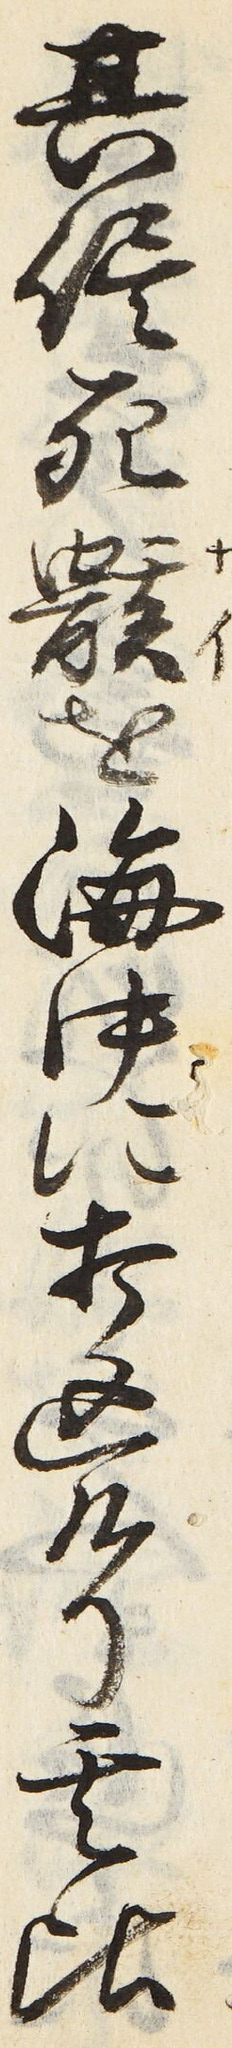其侭死骸を海中に打込けり其頃
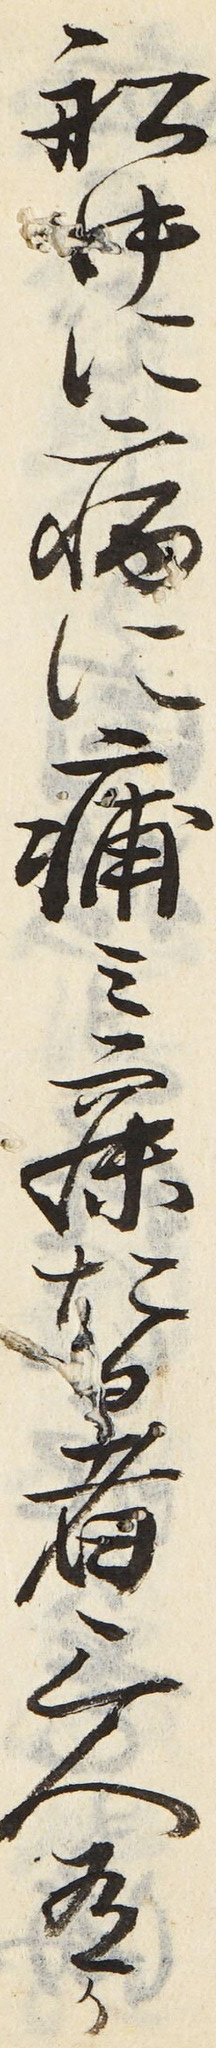船中に病に痛み寝たる者三人有り
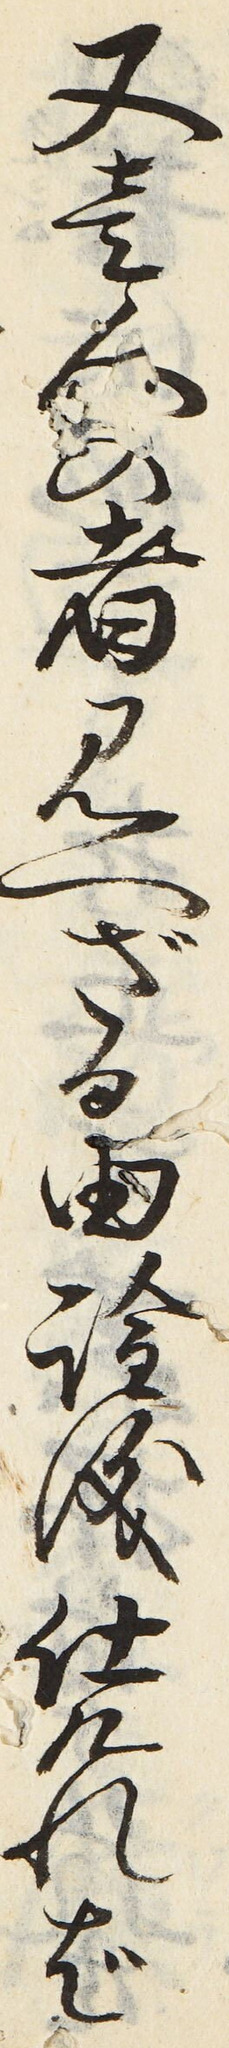又壱人の者見へざる由詮儀仕ければ
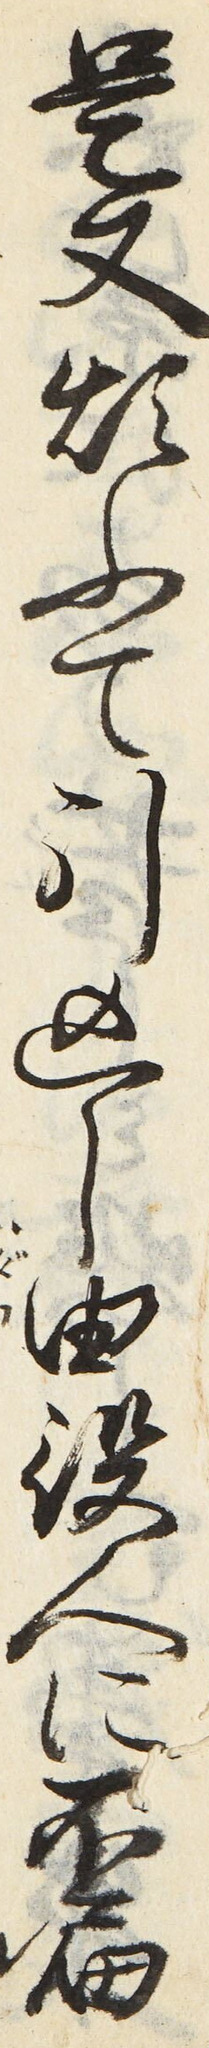是又煩ふて引込し由役人に不届
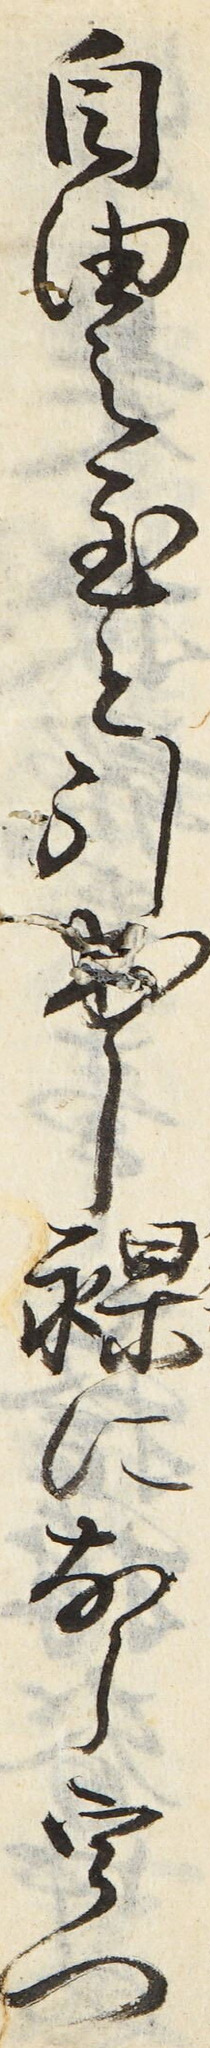自由の至と引出し裸になしうつ
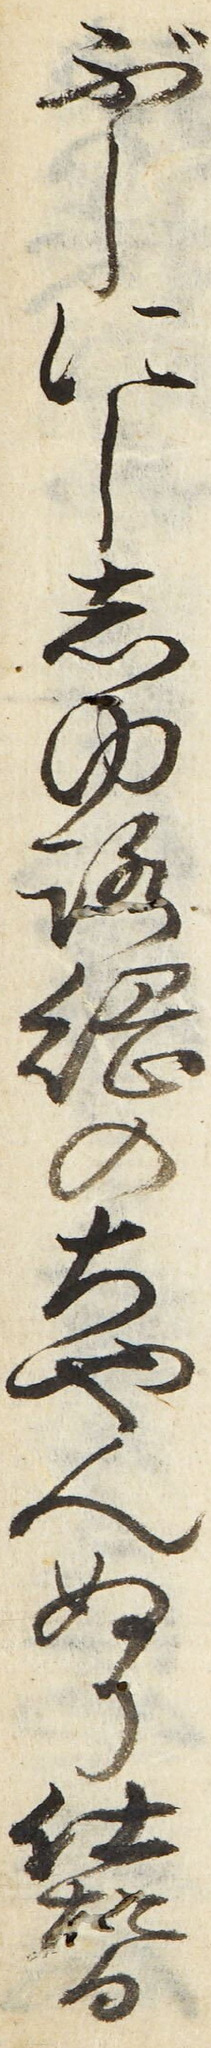ぶしにししゆろ綱のちやんぬり仕たる

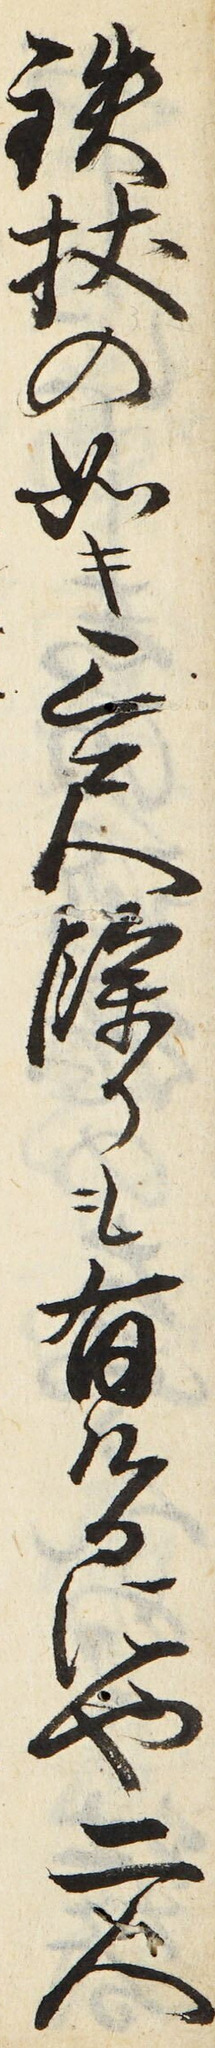鉄杖の如き三尺余りも有けるにや二人
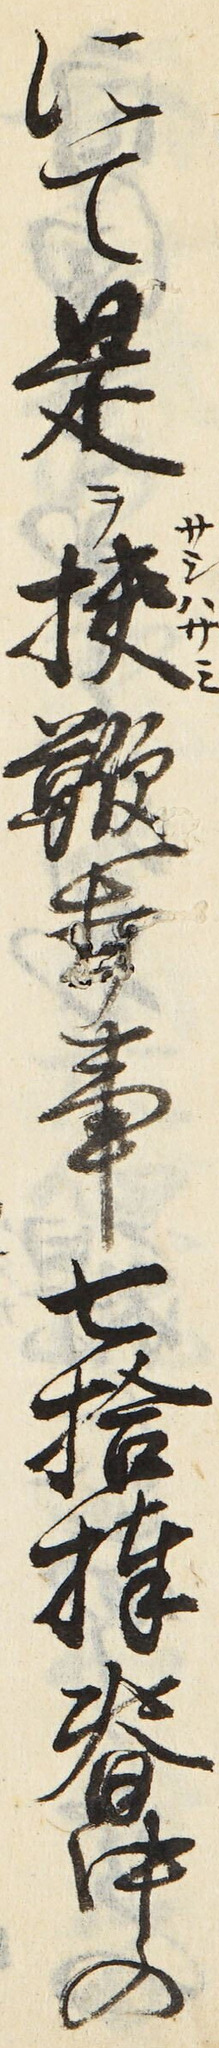にて是を挟鞭打事七拾棒背中の
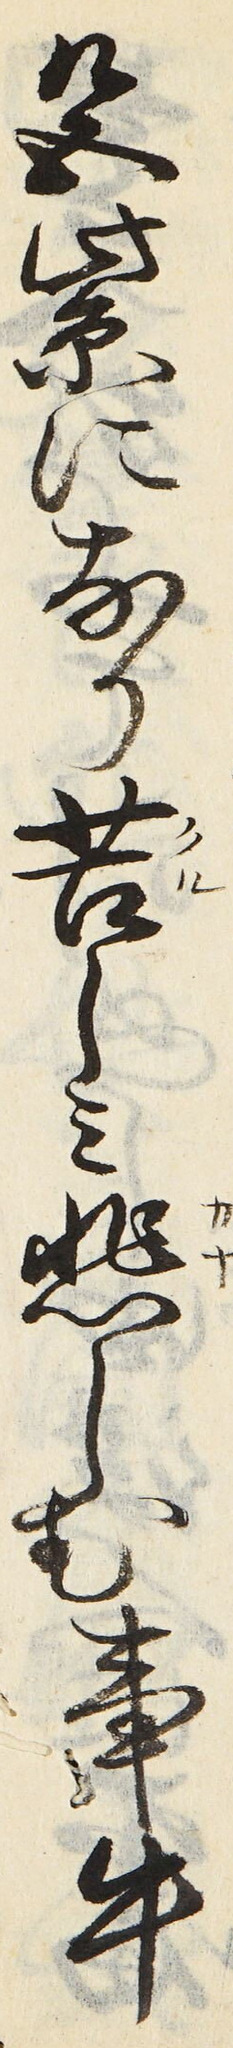色紫になり苦しみ悲しむ事牛
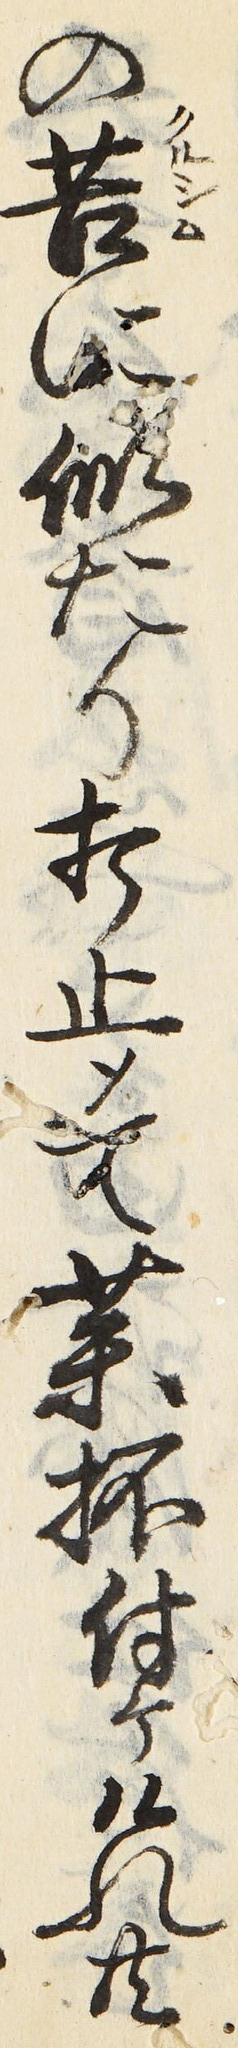の苦に似たり打止めて薬抔付けけれ共
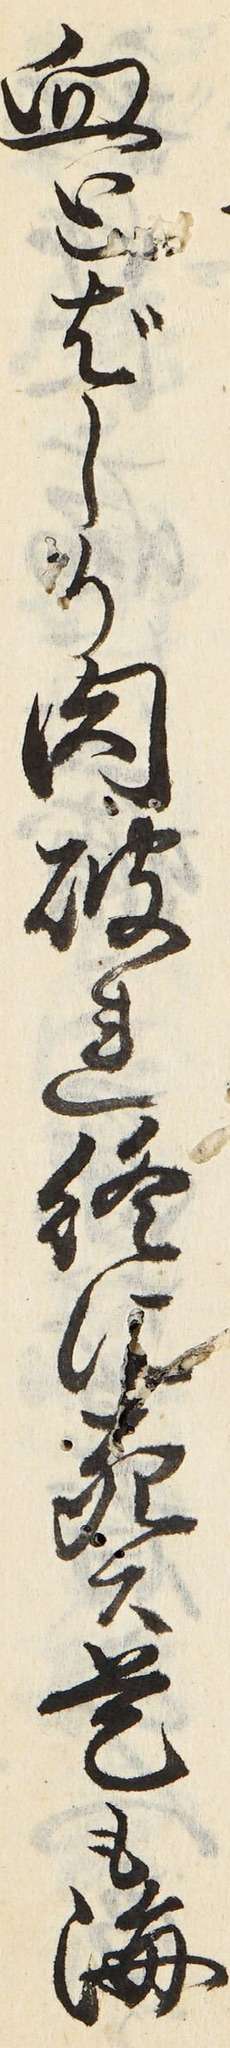血とばしり肉破れ終に死す是も海
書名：華夷九年録
